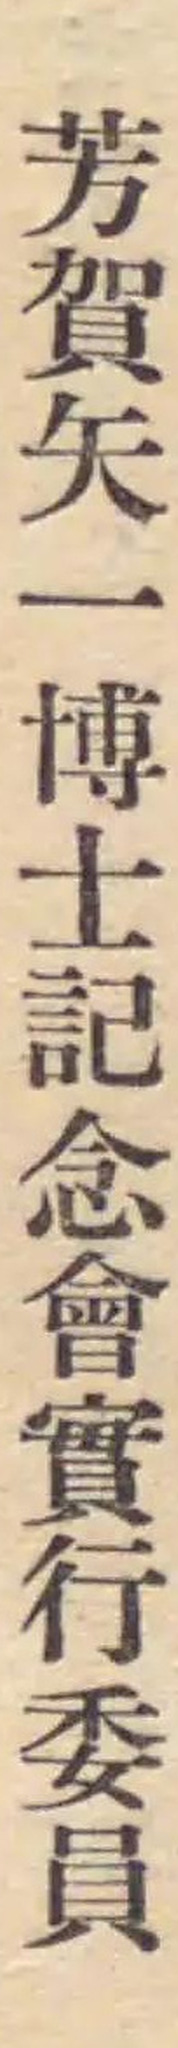芳賀矢一博士記念會實行委員
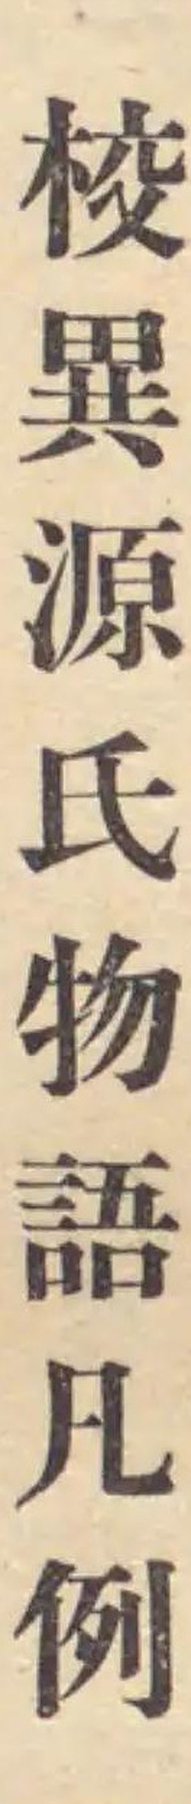校異源氏物語凡例
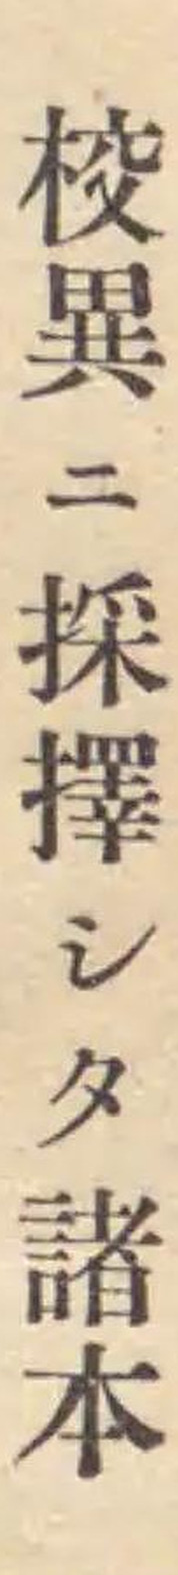校異ニ採択シタ諸本
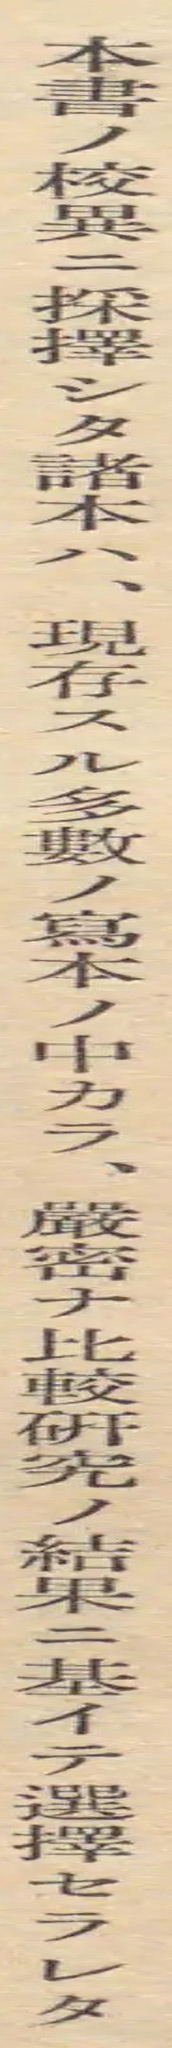本書ノ校異ニ採択シタ諸本ハ、現存スル多数ノ写本ノ中カラ、厳密ナ比較研究ノ結果ニ基イテ選択セラレタ
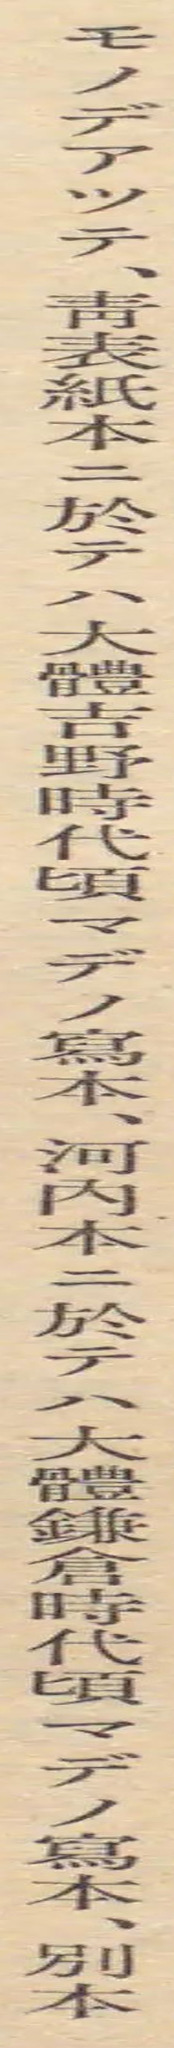モノデアツテ、青表紙本ニ於テハ大体吉野時代頃マデノ写本、河内本ニ於テハ大体鎌倉時代頃マデノ写本、別本
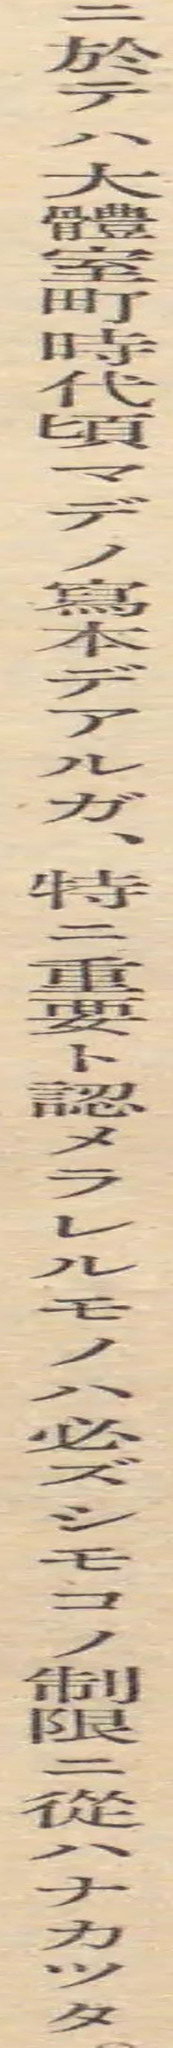ニ於テハ大体室町時代頃マデノ写本デアルガ、特ニ重要ト認メラレルモノハ必ズシモコノ制限ニ従ハナカツタ。
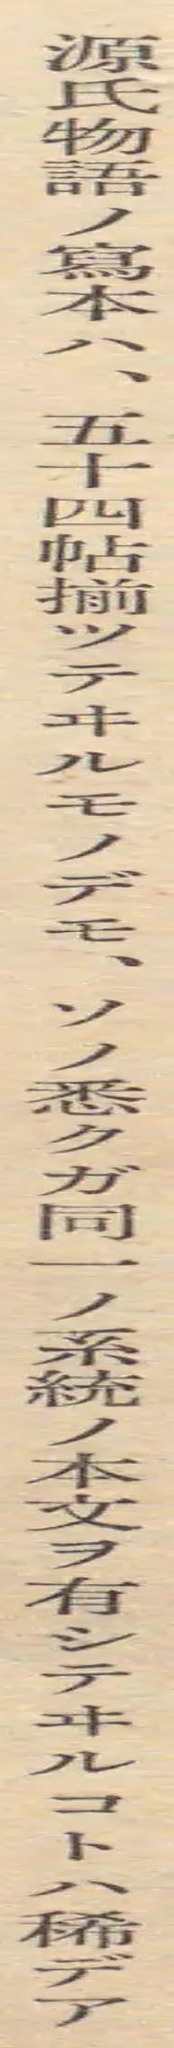源氏物語ノ写本ハ、五十四帖揃ツテヰルモノデモ、ソノ悉クガ同一ノ系統ノ本文ヲ有シテヰルコトハ稀デア
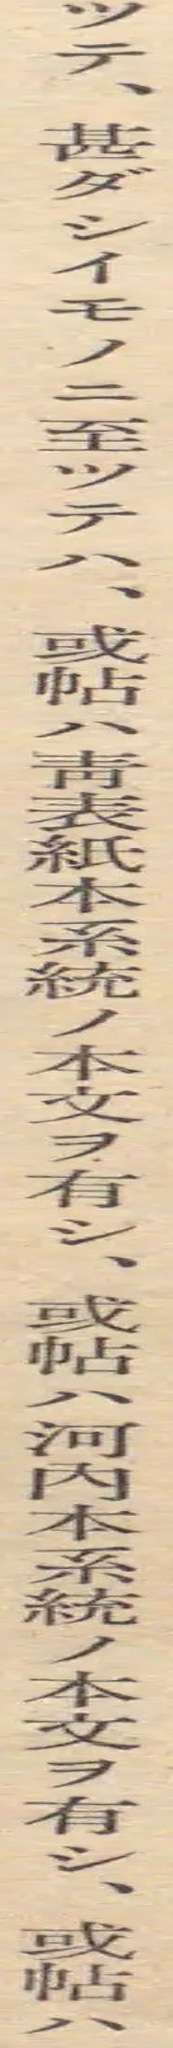ツテ、甚ダシイモノニ至ツテハ、或帖ハ青表紙本系統ノ本文ヲ有シ、或帖ハ河内本系統ノ本文ヲ有シ、或帖ハ
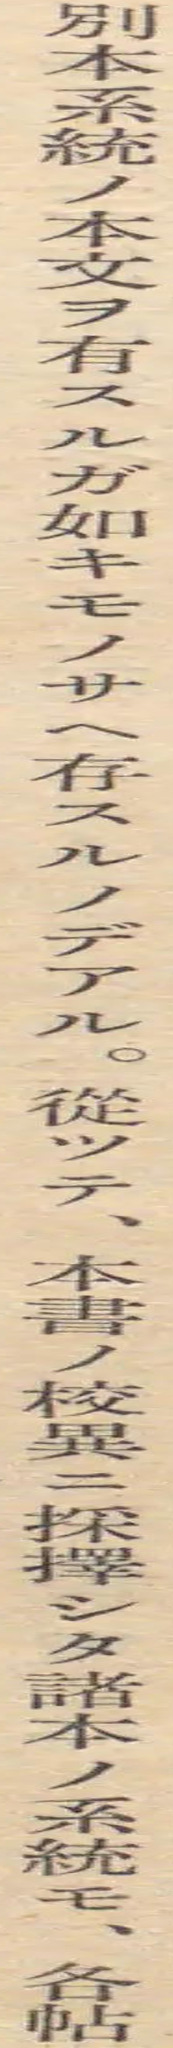別本系統ノ本文ヲ有スルガ如キモノサヘ存スルノデアル。従ツテ、本書ノ校異ニ採択シタ諸本ノ系統モ、各帖
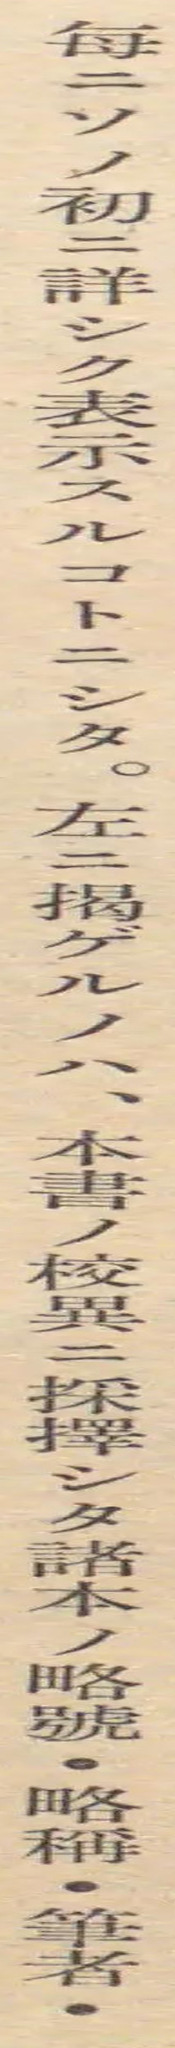毎ニソノ初ニ詳シク表示スルコトニシタ。左ニ掲ゲルノハ、本書ノ校異ニ採択シタ諸本ノ略号・略称・筆者・
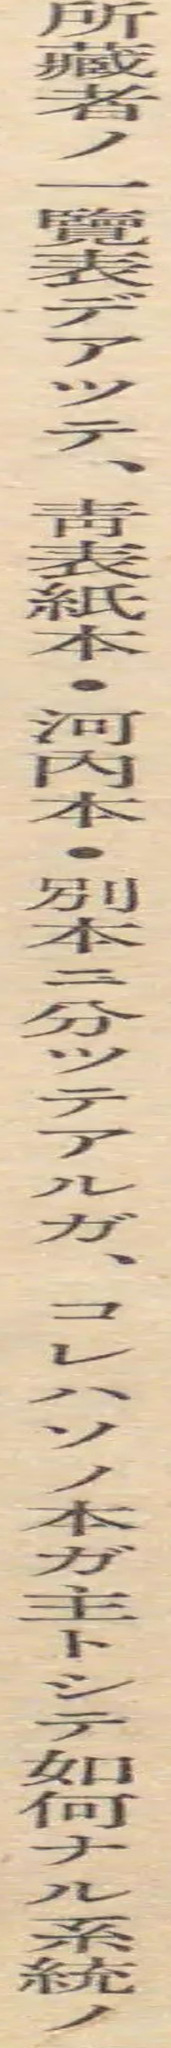所蔵者ノ一覧表デアツテ、青表紙本・河内本・別本ニ分ツテアルガ、コレハソノ本ガ主トシテ如何ナル系統ノ
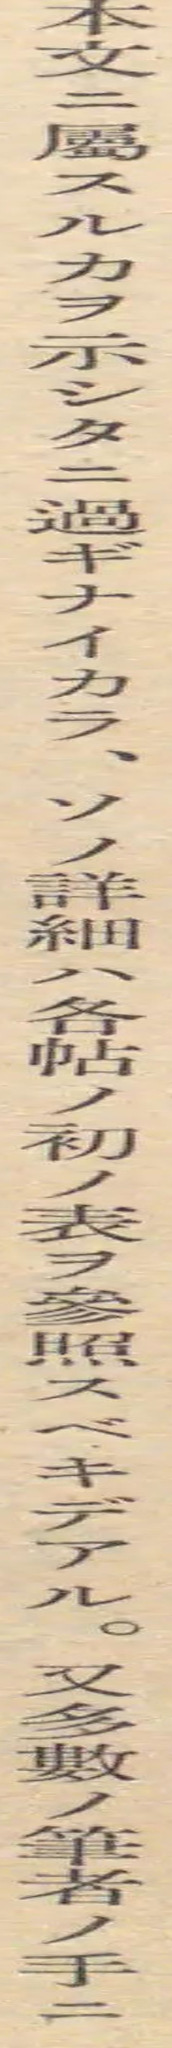本文ニ属スルカヲ示シタニ過ギナイカラ、ソノ詳細ハ各帖ノ初ノ表ヲ参照スベキデアル。又多数ノ筆者ノ手ニ
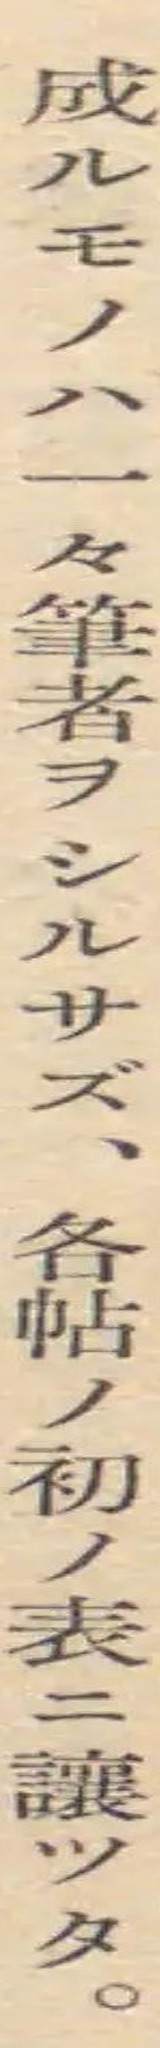成ルモノハ一々筆者ヲシルサズ、各帖ノ初ノ表ニ譲ツタ。
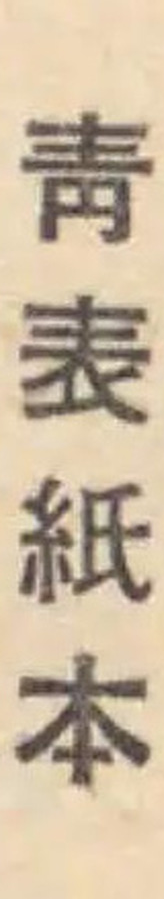青表紙本
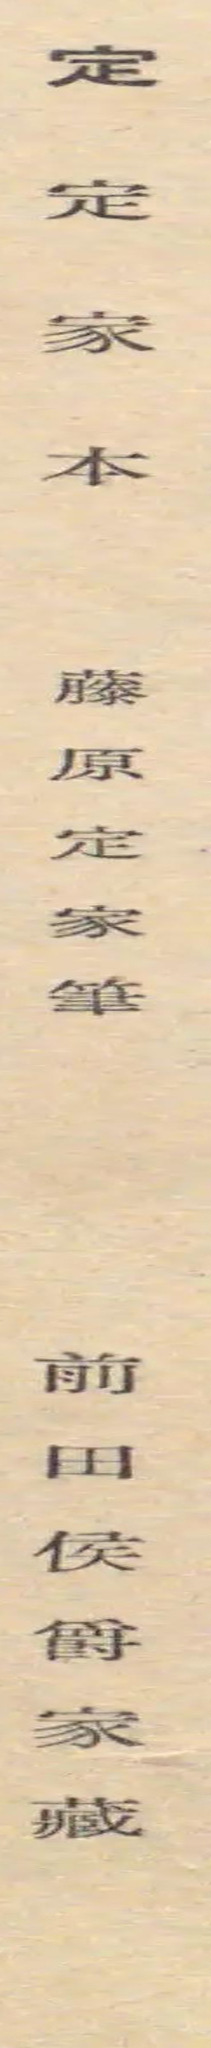定定家本藤原定家筆前田侯爵家蔵

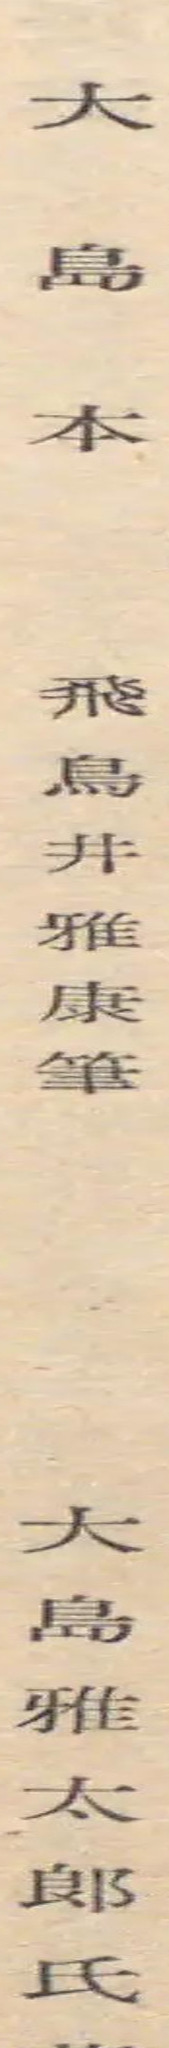大大島本飛鳥井雅康筆大島雅太郎氏蔵
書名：校異源氏物語.
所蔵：国立国会図書館 National Diet Library, JAPAN
